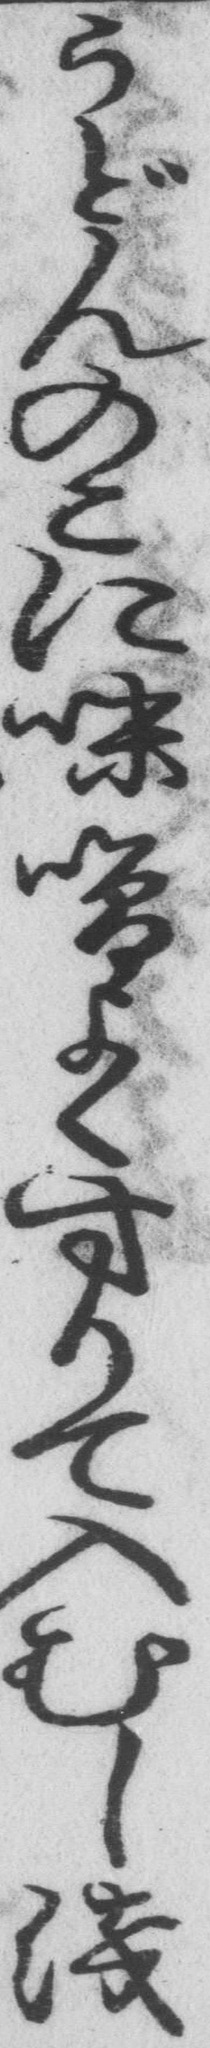うどんのこに味噌よくすりて入むし浅
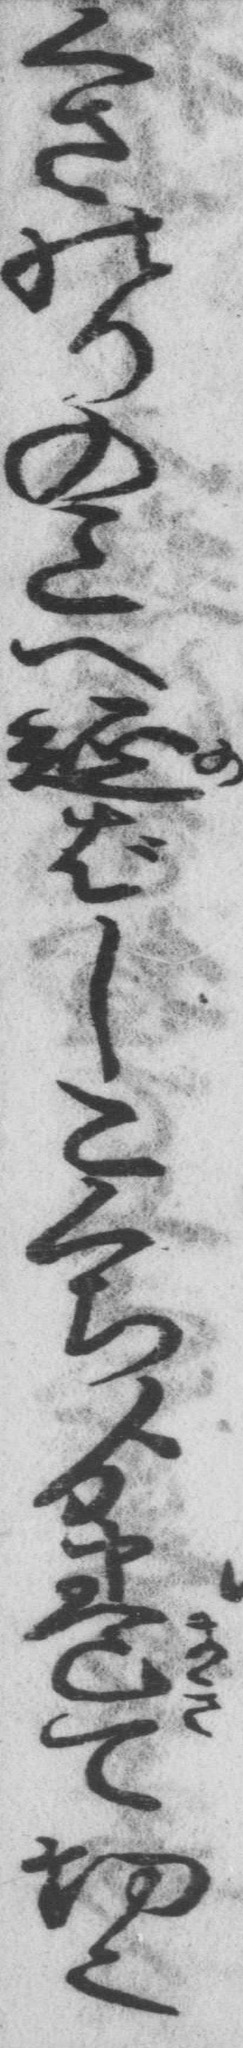くさのりの上へ延ばしこくちゟ巻て切也
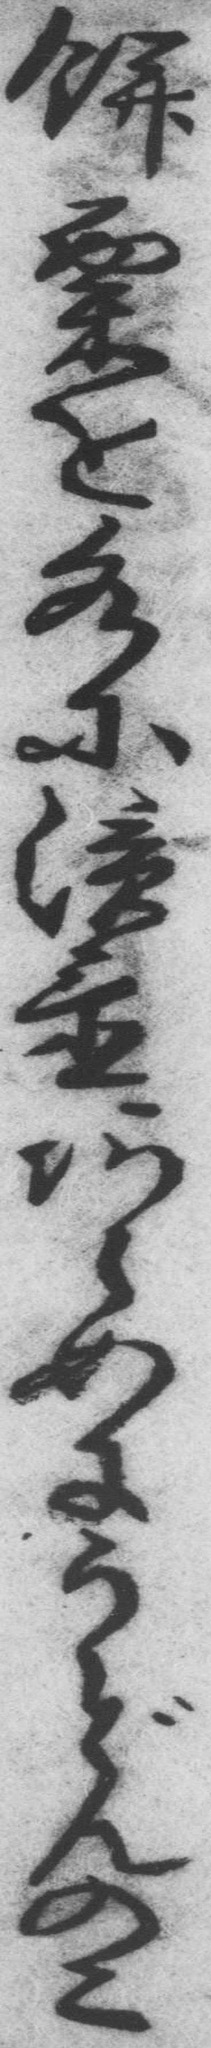餅粟を水に漬置あらめにうどんのこ
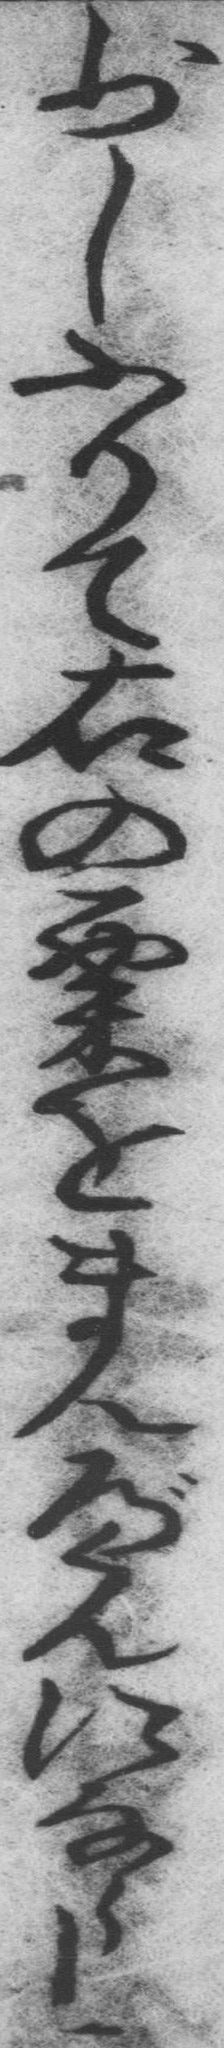少しふりて右の粟をまんべんにならし
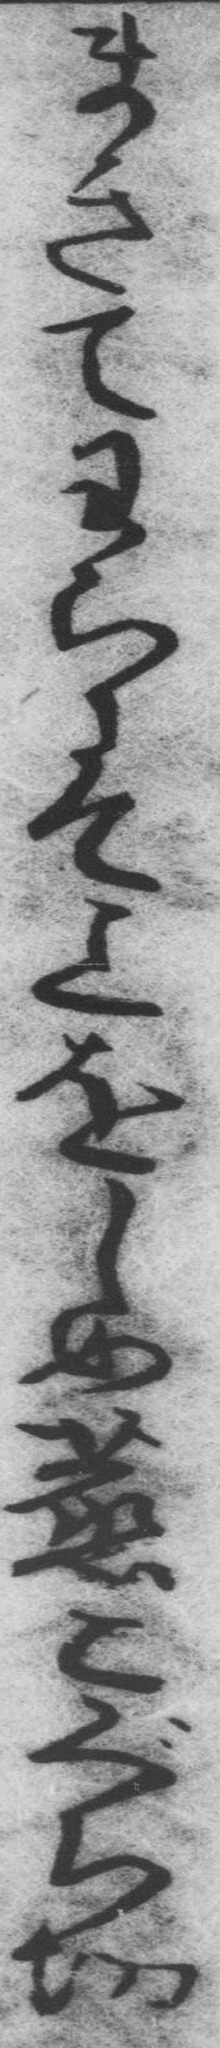まきてわらにて上をしめ蒸こぐち切
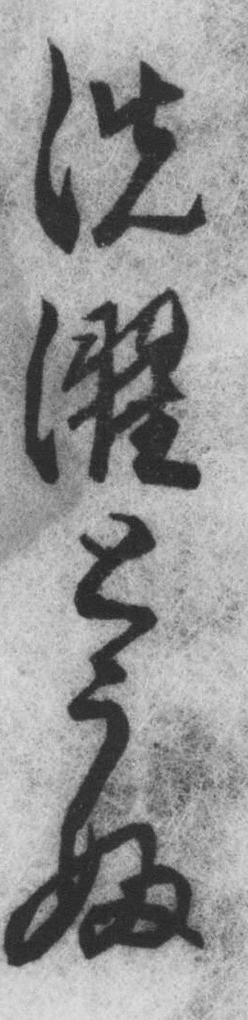洗濯とうふ
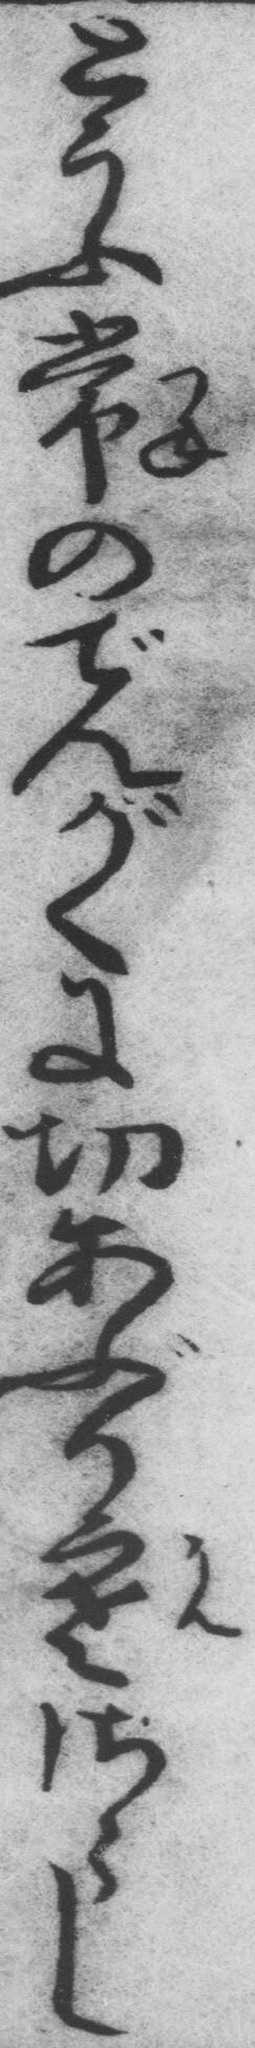とうふ常のでんがくに切あぶり寒さらし
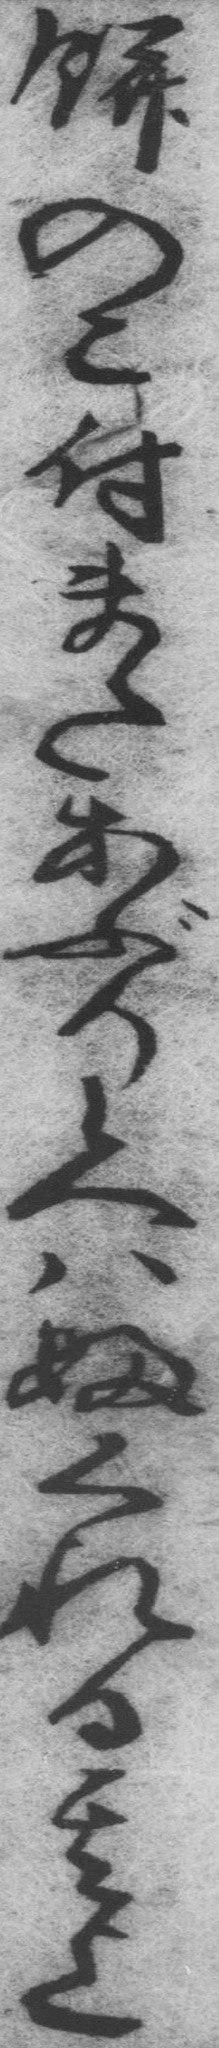餅のこ付またあぶり候へはふくれる其上

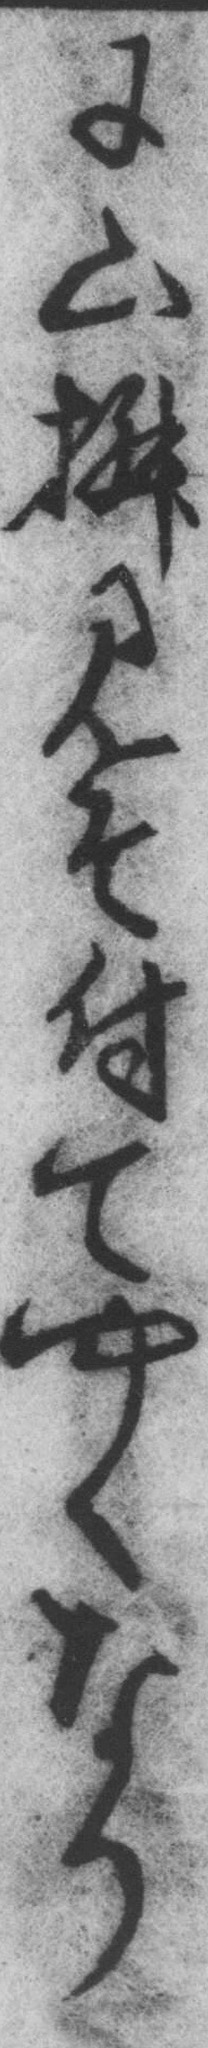に山椒みそ付てやくなり
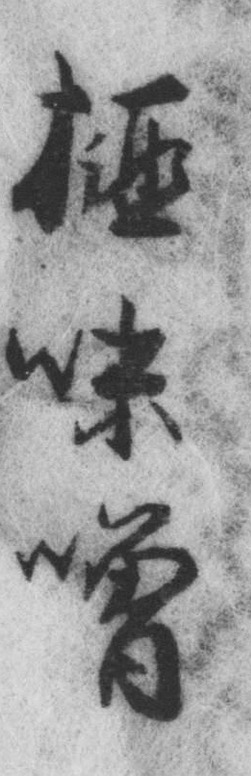榧味噌
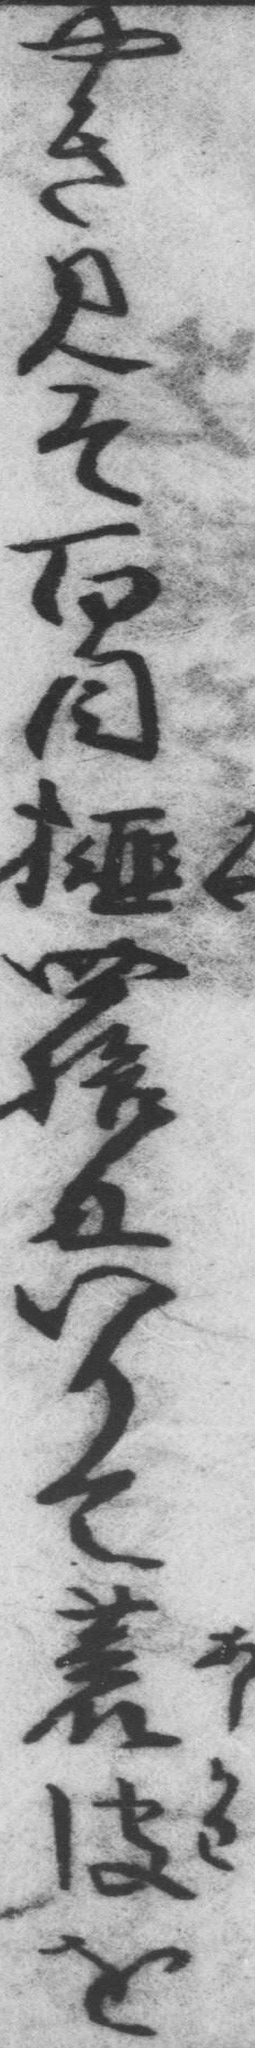やきみそ百目榧四拾匁いりて荒皮を
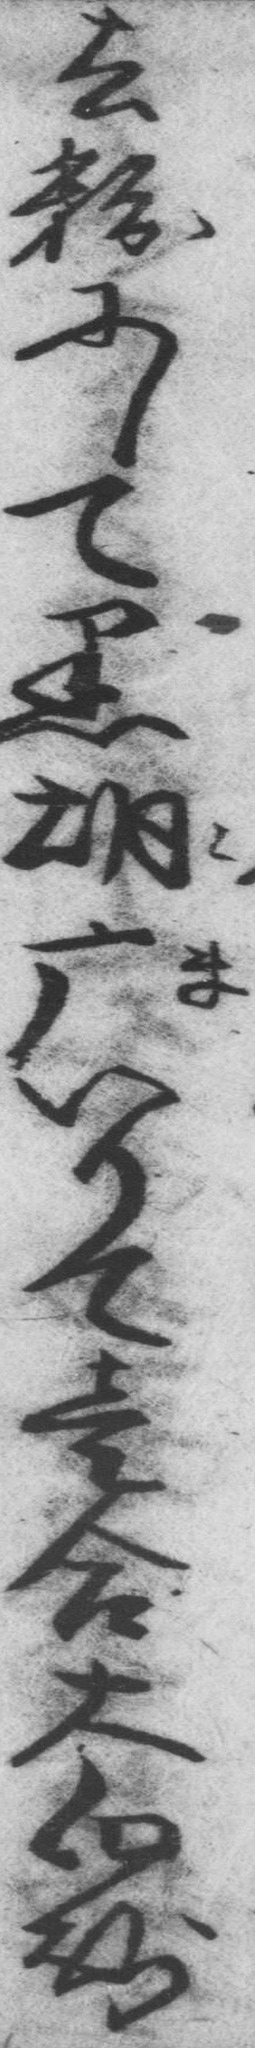去粉にして黒胡麻いりて壱合大白砂
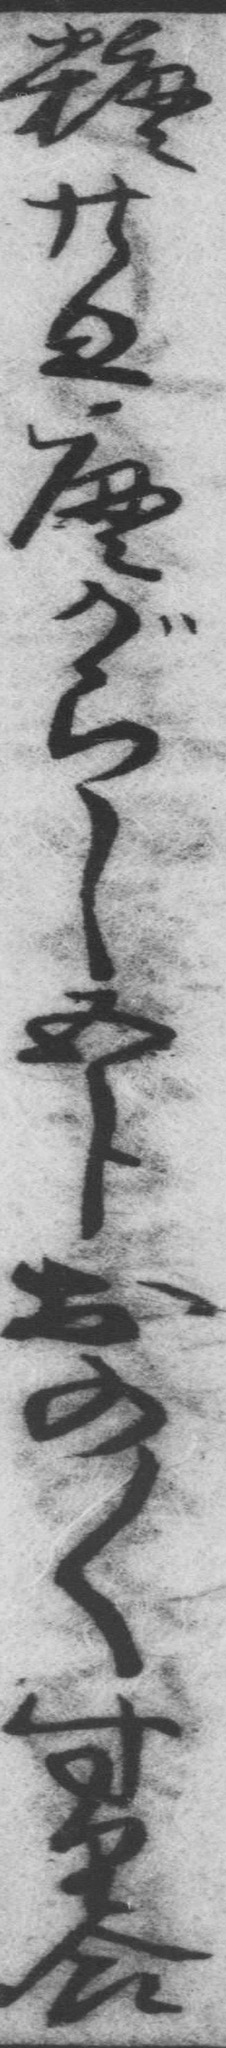糖廿匁唐がらし五分おの〳〵すり合
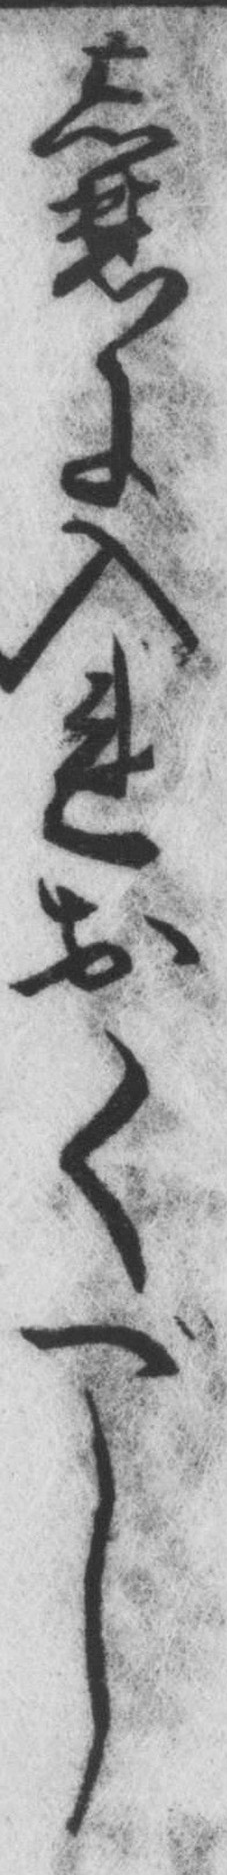壺に入れおくべし
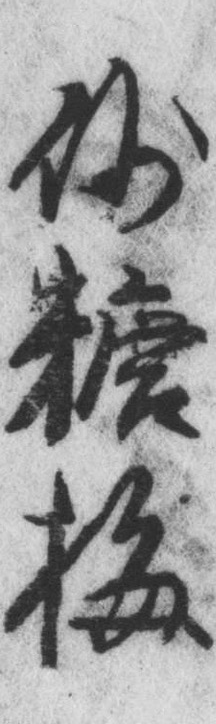砂糖梅
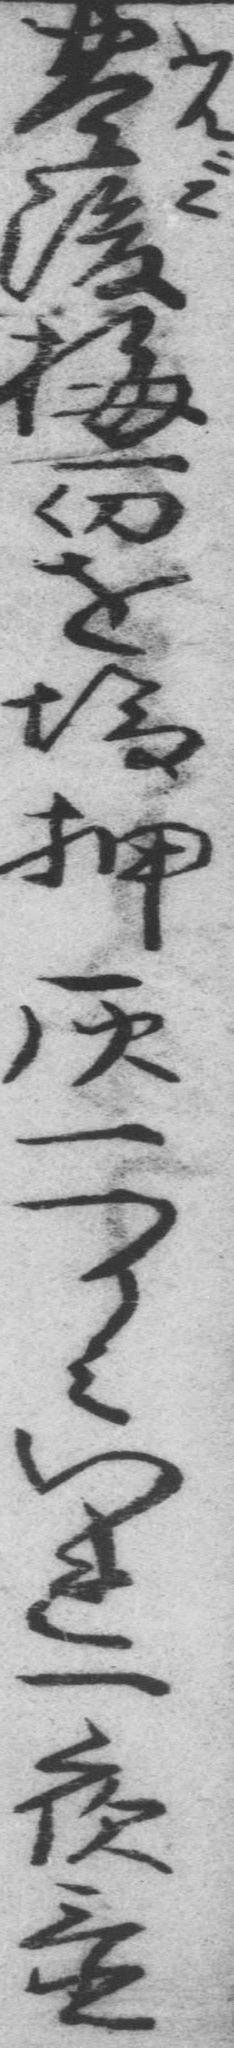豊後梅百を塩押灰一つかみいれ一夜置
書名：料理山海郷
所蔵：大阪府立大学学術情報センター 国文学研究資料館
